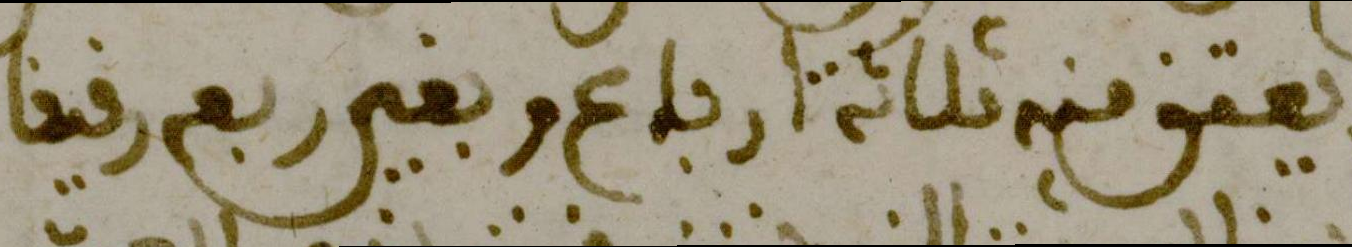يعتق منه ثلاثة ارباع وبقي ربعه رقيقا
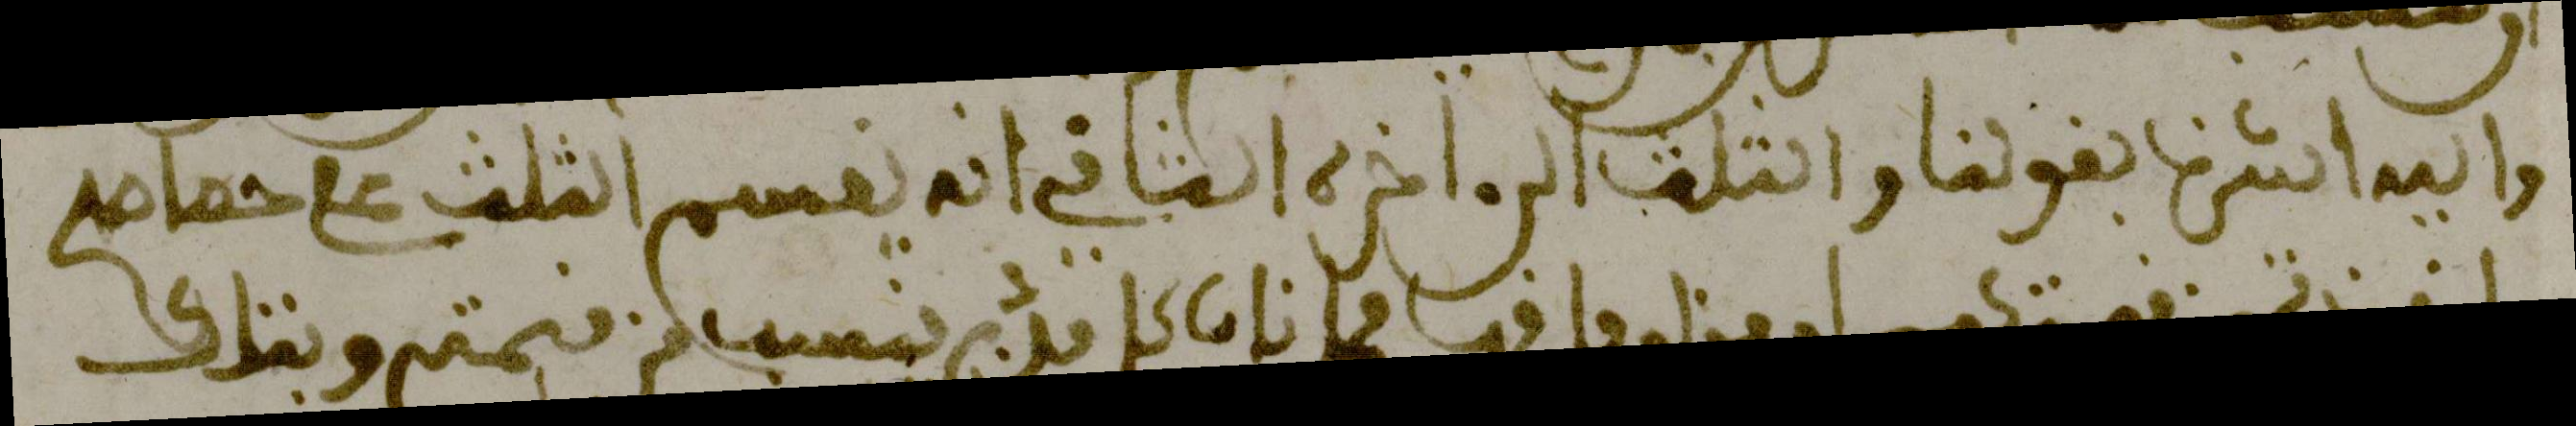واليه اشرن بقولنا والثلث الى ءاخره الثاني انه يقسم الثلث على حصاصهم
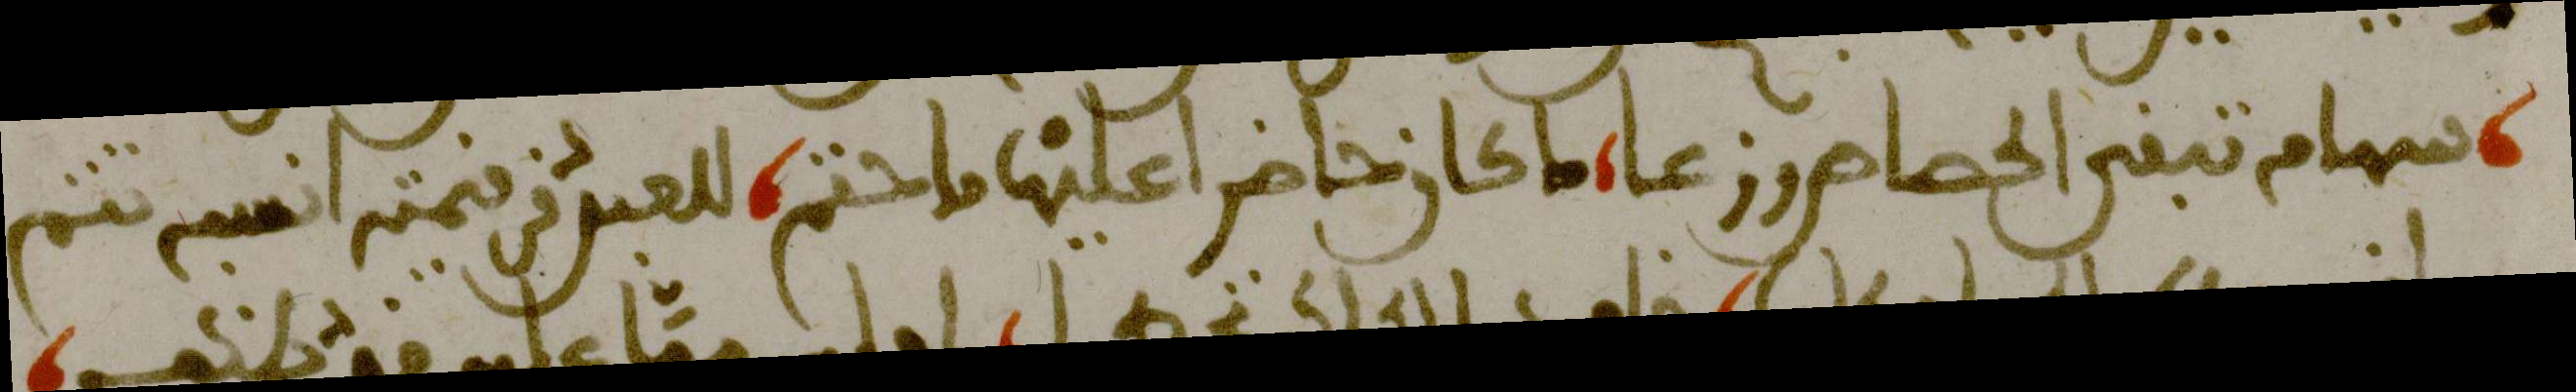سهامه تبقى الحصاص وزعا ما كان حاضرا عليْها ما حتم للعبد من قيمته انسب تتم
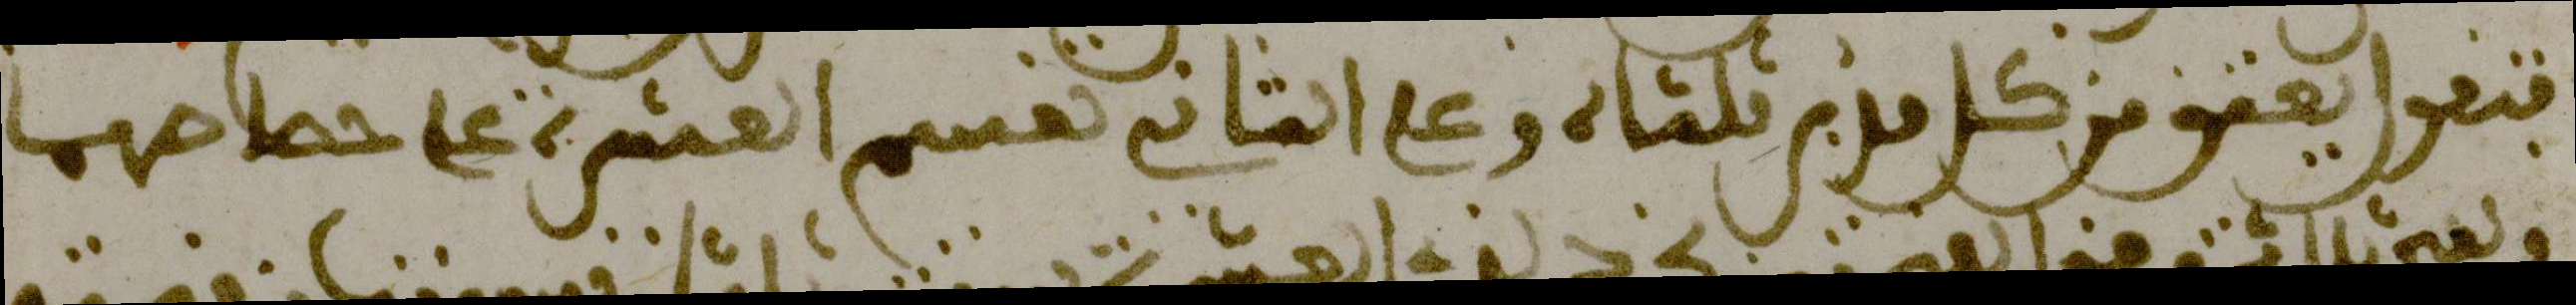فتقول يعتق من كل مدبر ثلثاه وعلى الثاني تقسم العشرة على حصاصها
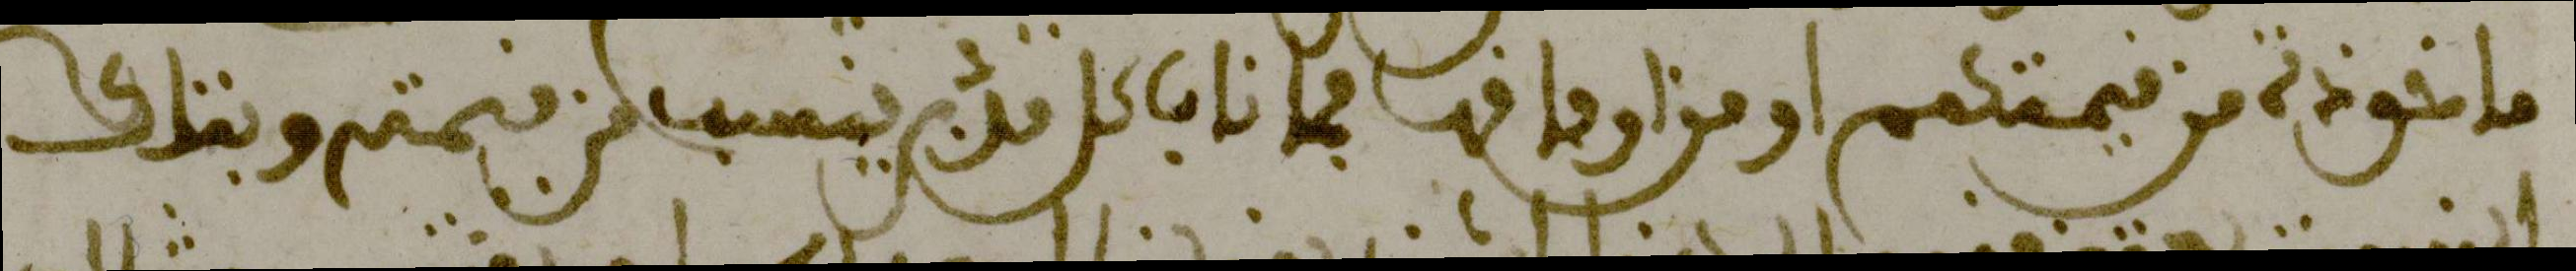ماخوذة من قيمتهم او من اوفاقها فما ناب كل مدبر ينسب من قيمته وبتلك
